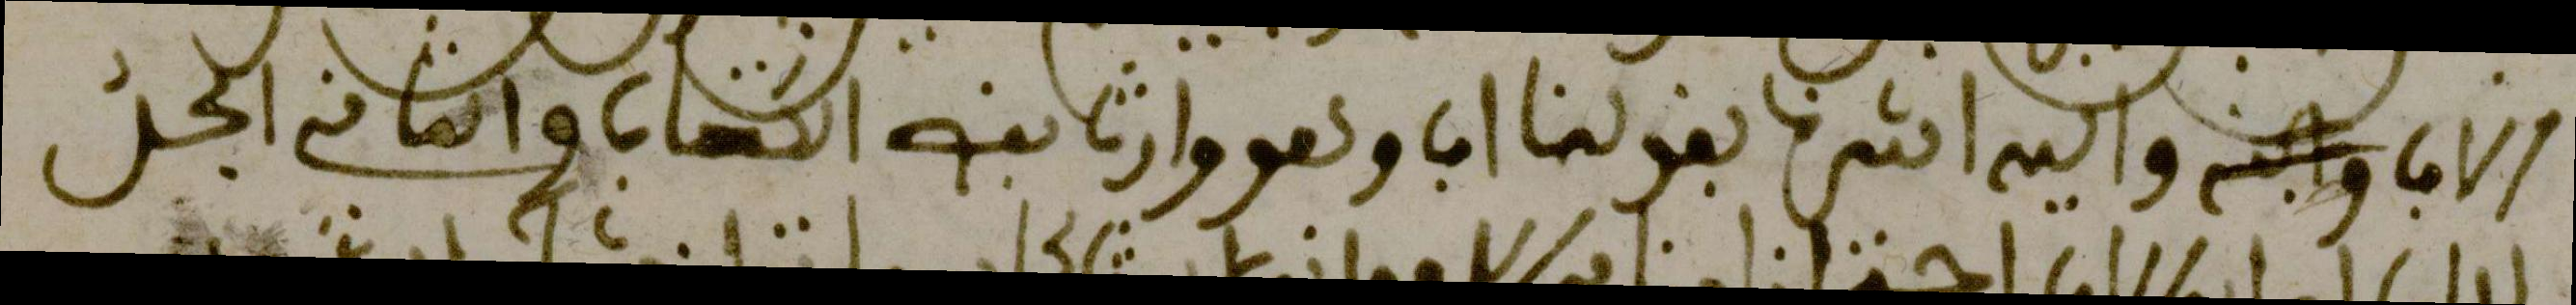الاب وابنه واليه اشرن بقولنا اب وهو وارث بنص الكتاب والثاني الجد
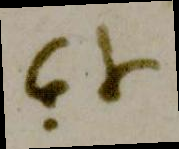لاب
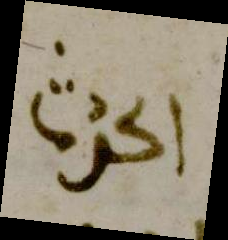الحدث
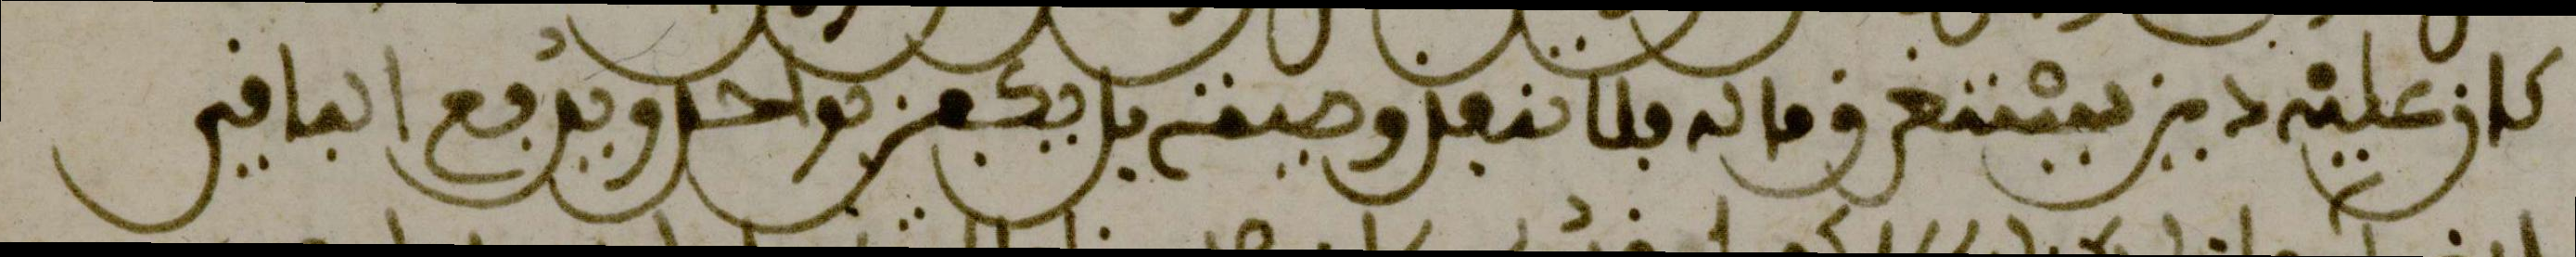كان عليْه دين يسْتغرق ماله فلا تنفذ وصيته بل يكفن بواحد ويدفع الباقي
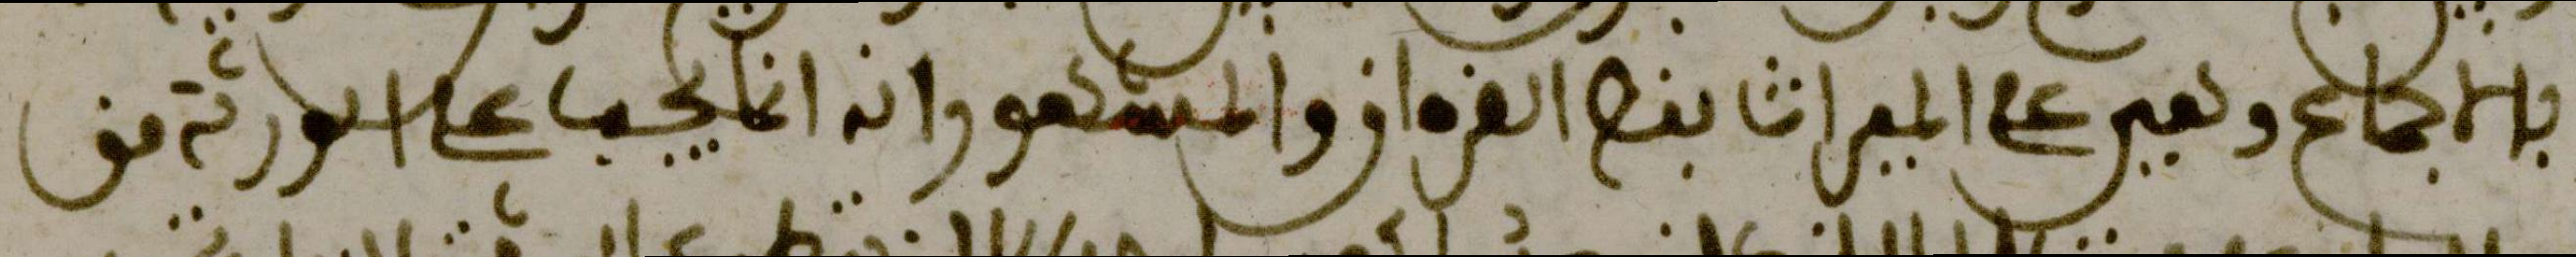بالاجماع وهي على الميراث بنص القرءان والمشهور انه انما يجب على الورثة من
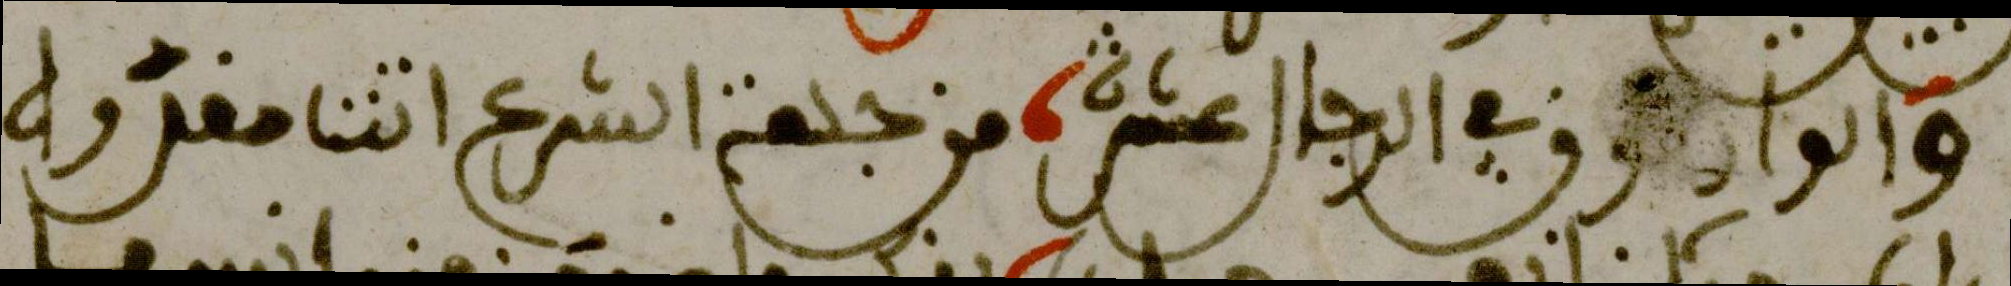وَالو ن في الرجال عشرة من جهة الشرع اتت مقرره
